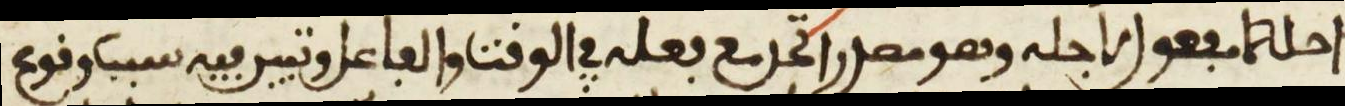اجلالا مفعول لاجله و هو مصدر اتحد مع فعله في الوقت و الفاعل و تبين فيه سبب وقوع
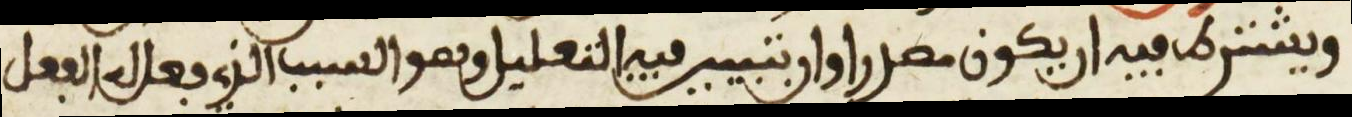و يشترط فيه ان يكون مصدرا و ان تبيين فيه التعليل وهو السبب الذي فعل له الفعل
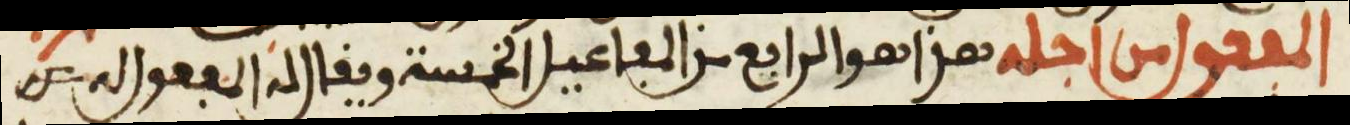المفعول من اجله هذا هو الرافع من المفاعيل الخمسة و يقال له المفعول له
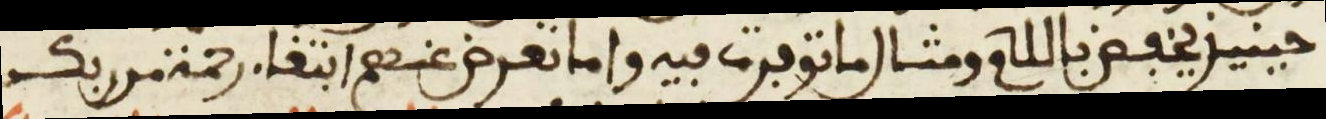حينئذ يخفض باللام و مثال ما توفرت فيه و اما تعرض عنهم ابتغاء رحمة من ربكم
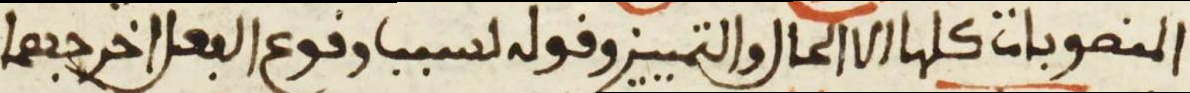المنصوبات كلها الا الحال و التمييز و قوله لسبب وقوع الفعل اخرجها
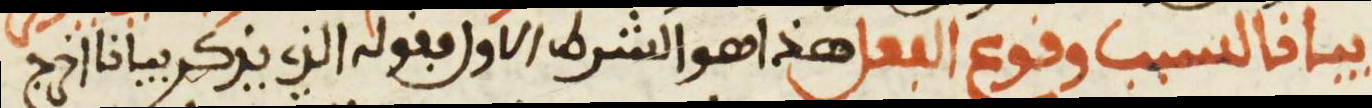بيانا لسبب وقوع الفعل هذا هو الشرط الاول بقوله الذي يذكر بيانا اخرج
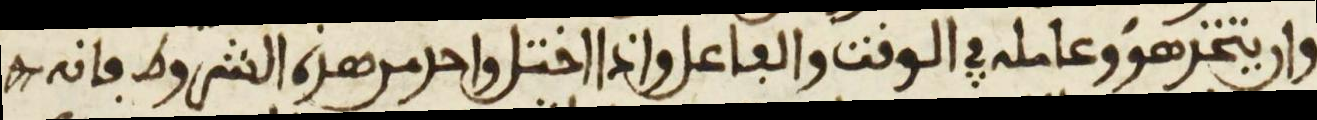و ان يتخذ هو و عامله في الوقت و الفاعل و اذا اختل واحد من هذه الشروط فانه
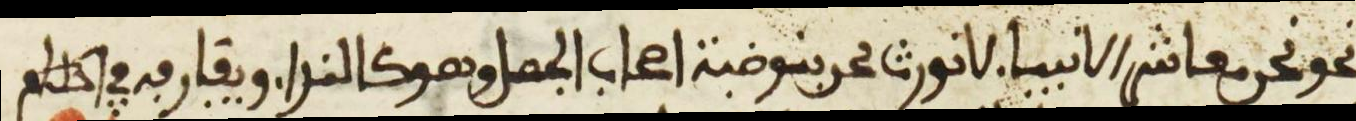نحونحن معاشر الانبياء لا نورث نحن بنو ضبة اصحاب الجمل و هو كالنداء و يقاربه في الكلام
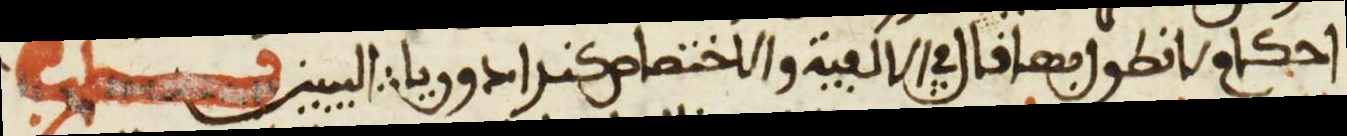احكام لا نطول بها قال في الالفية و الاختصاص كنداء دون يا البيين باب
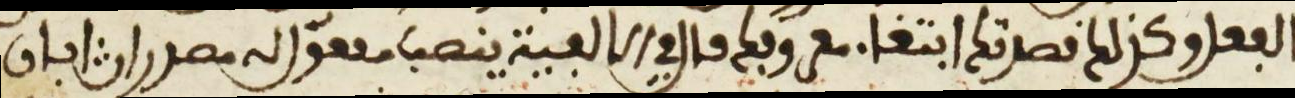الفعل و كذلك قصدتك ابتغاء معروفك قال في الالفية ينصب مفعول له مصدران ابان
